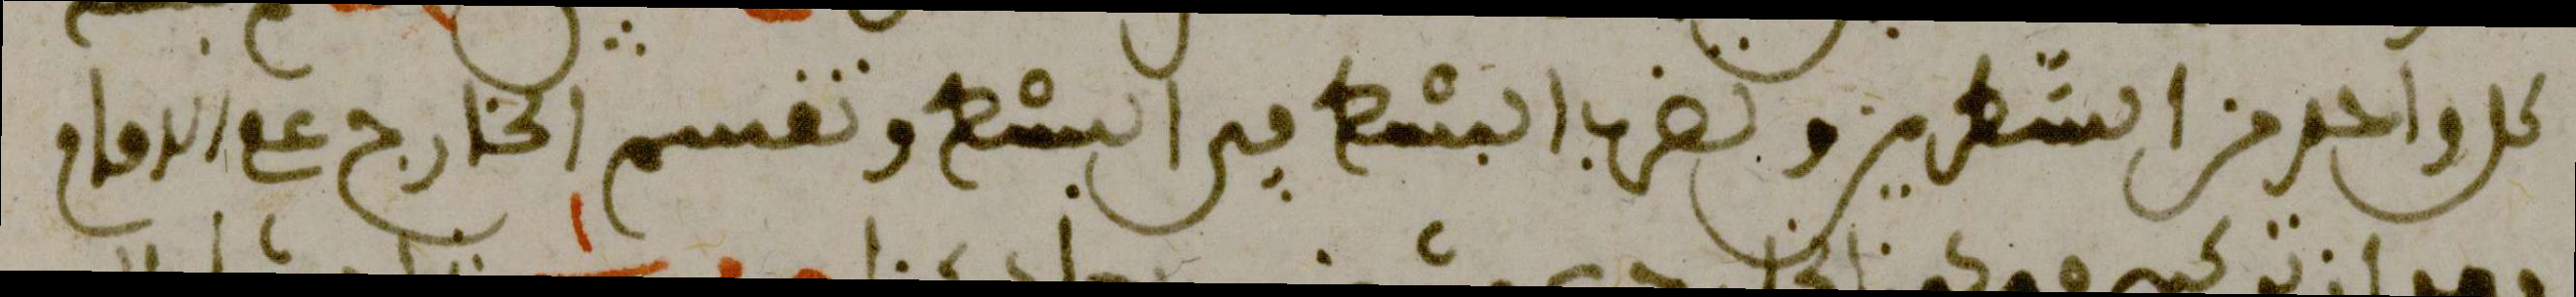كل واحد من السّطرين و تضرب البسط في البسط و تقسم الخارج على الامام
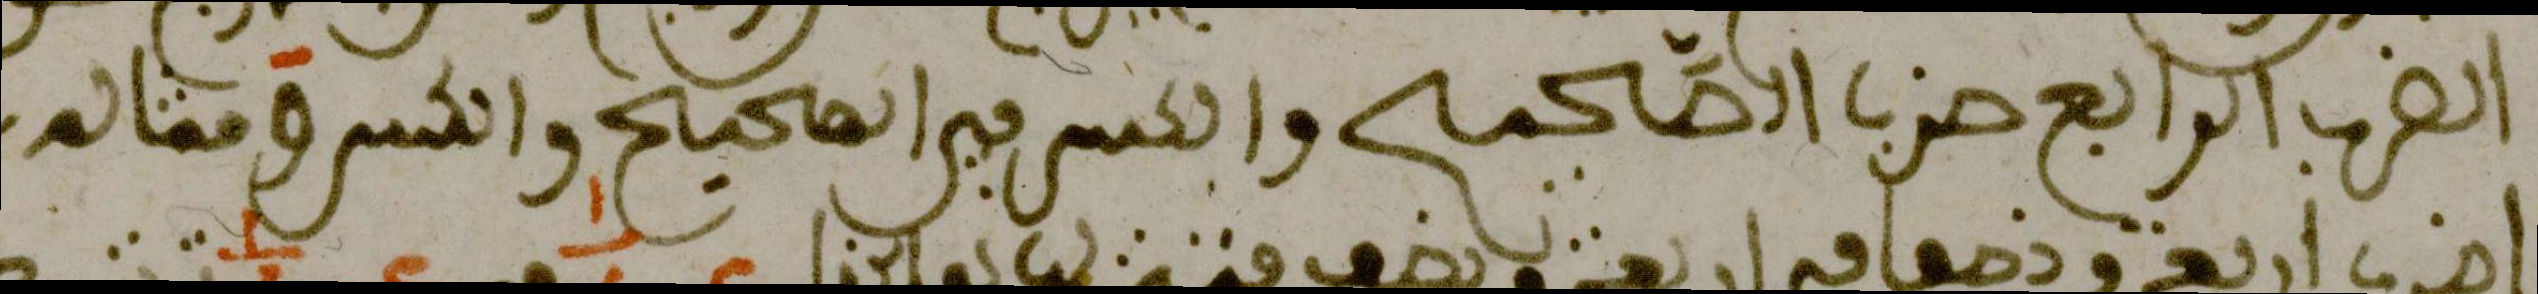الضرب الرابع ضرب الصّحيح و الكسر في الصحيح و الكسر و مثاله
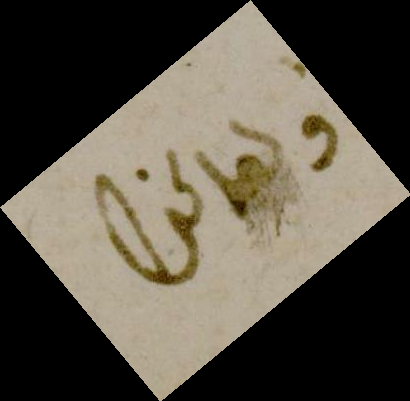و هاكذا
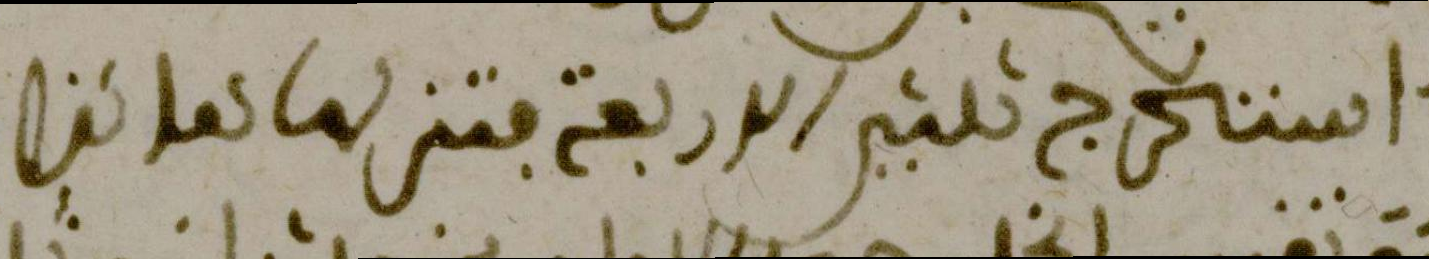استخرج ثلثين الاربعة فتنزلها هاكذا
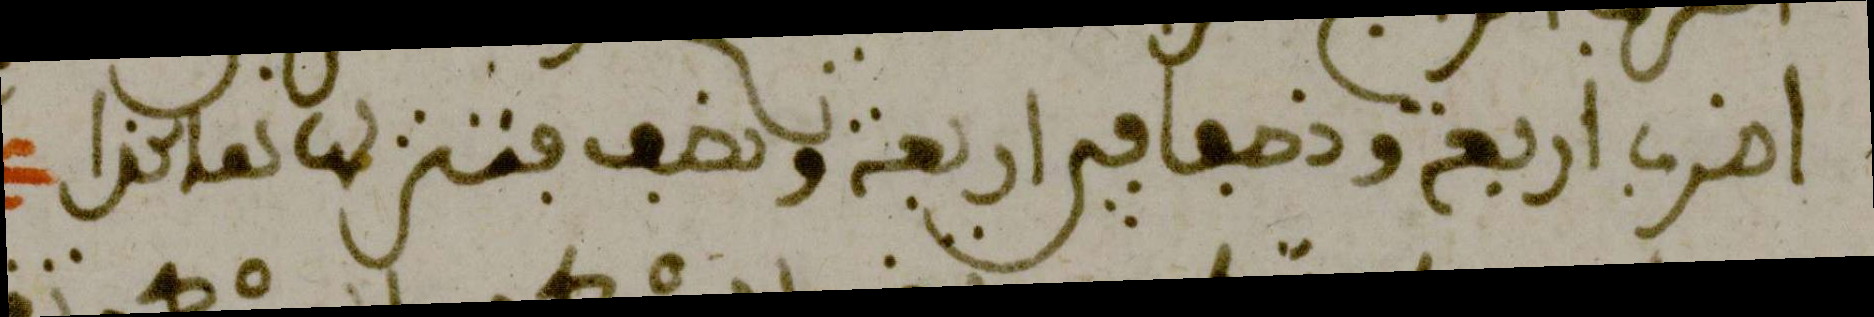اضرب اربعة و نصفا في اربعة و نصف فتنزله هاكذا
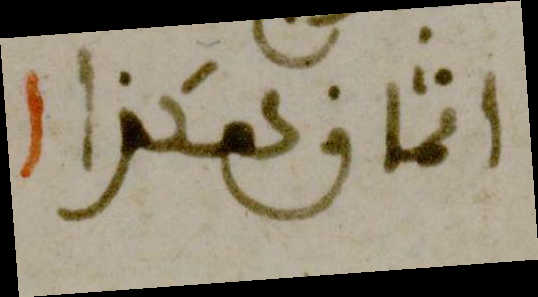اثمان و هكذا
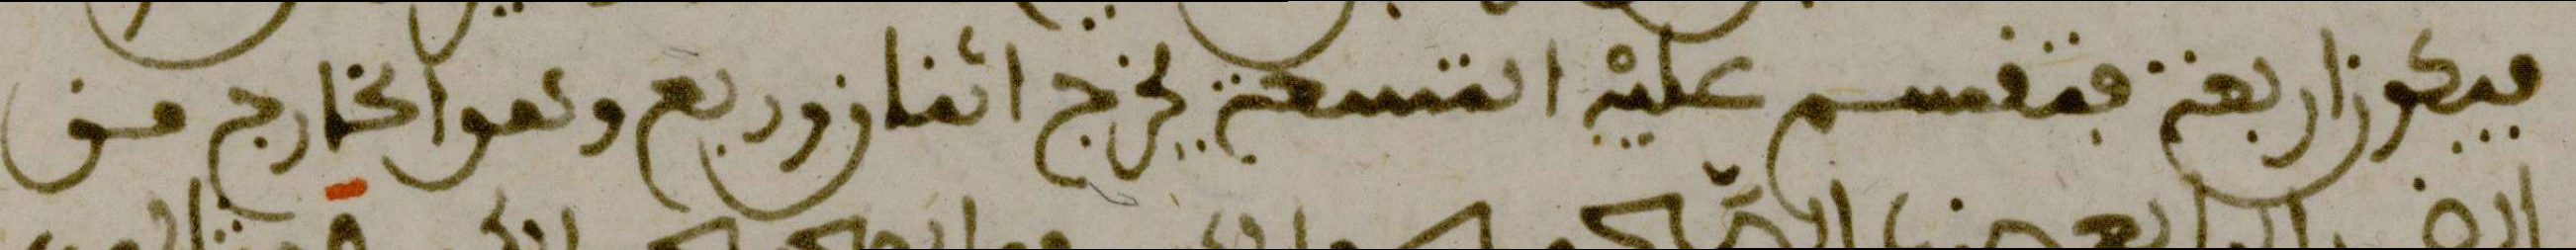فيكون اربعة فتقسم عليه التسعة يخرج اثنان و ربع و هو الخارج من
